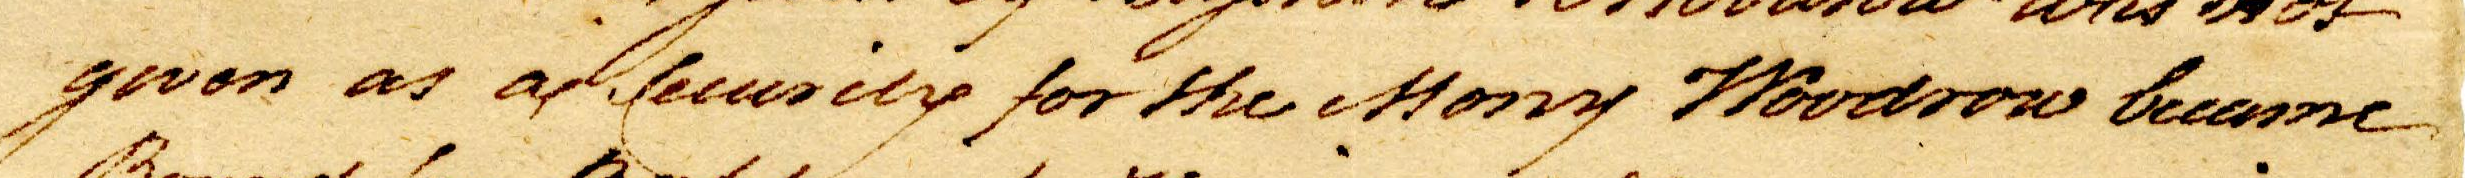given as a Security for the Mony Woodrow became
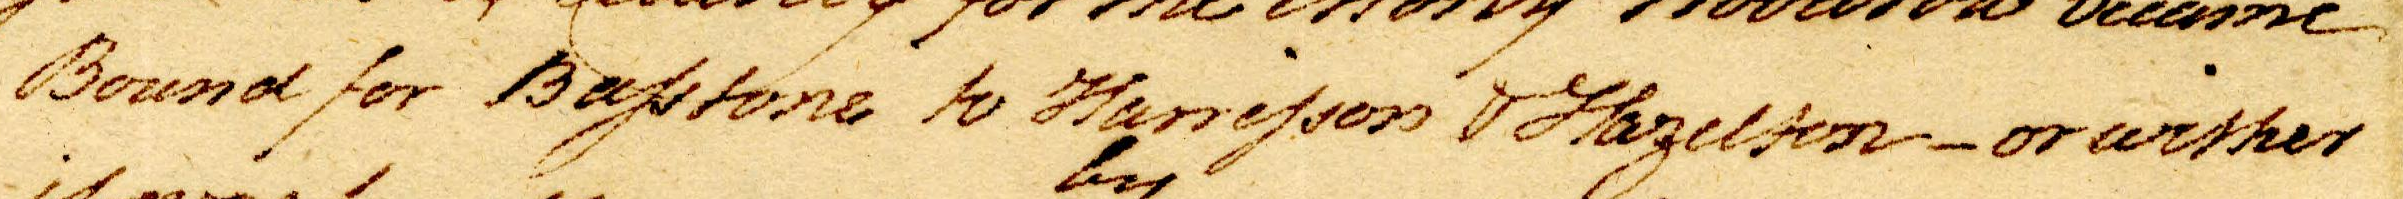Bound for Basstone to Harrison & Hazelton or wither
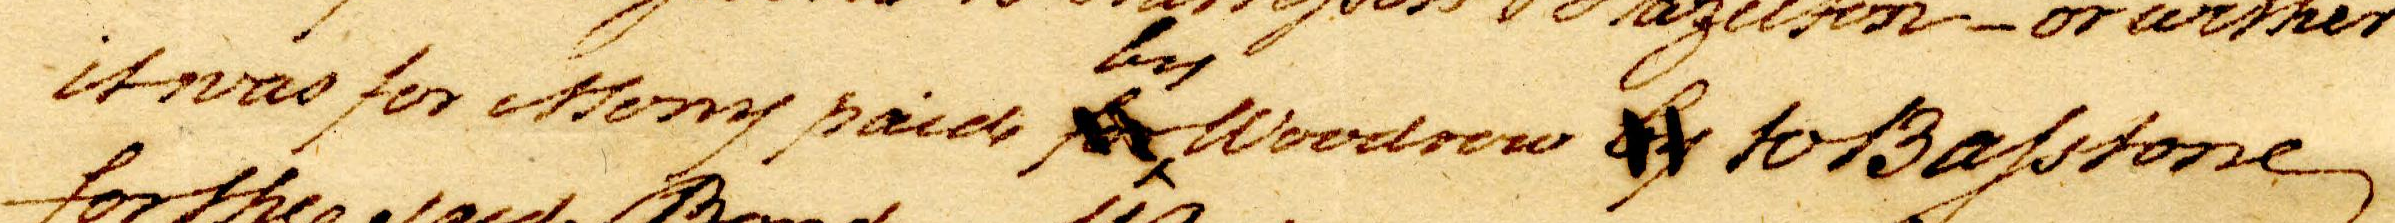it was for Mony paid [for] ^ Woodrow [by] to Basstone
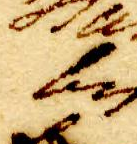has
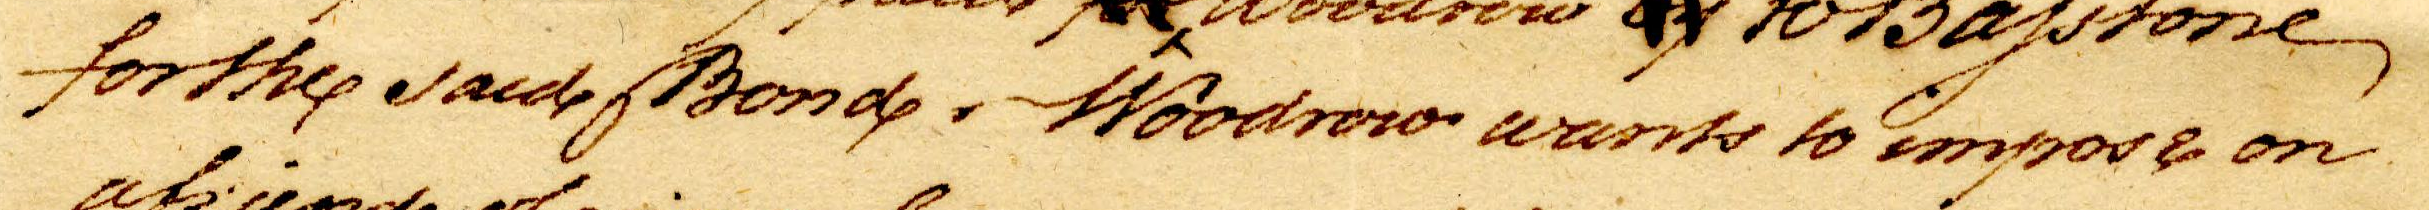for the said Bond. Woodrow wants to impose on
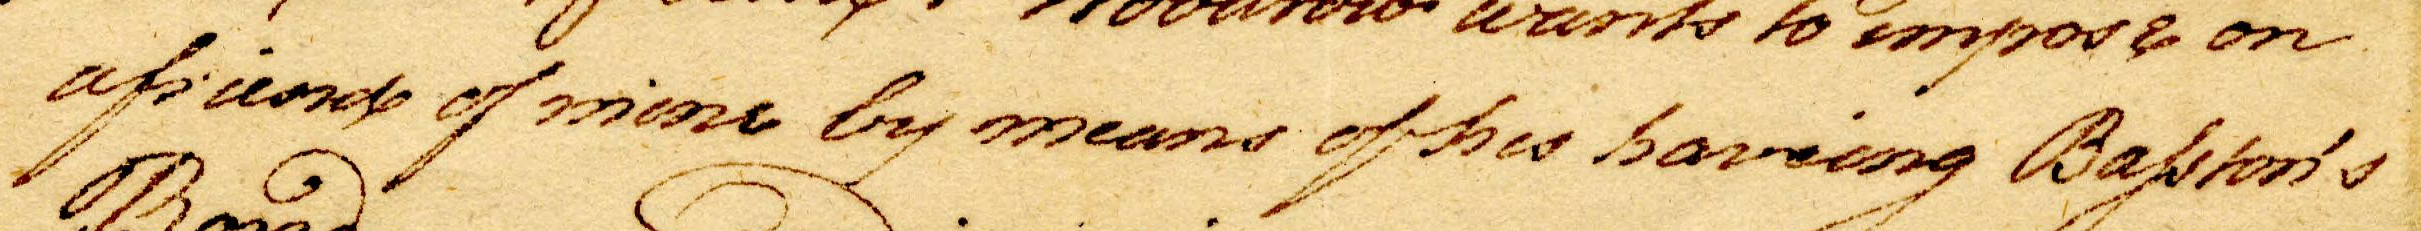a friend of mine by means of his having Basston's
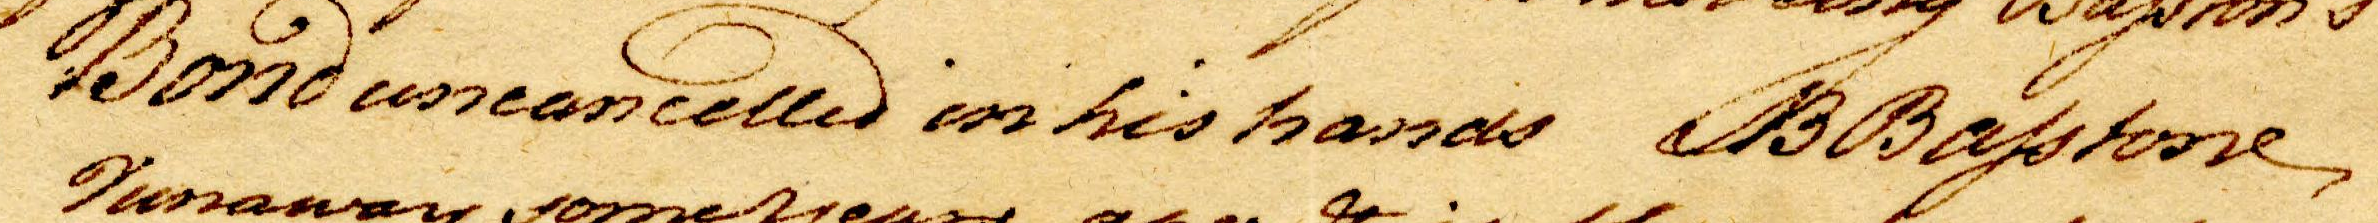Bond uncancelled in his hands B.Basstone
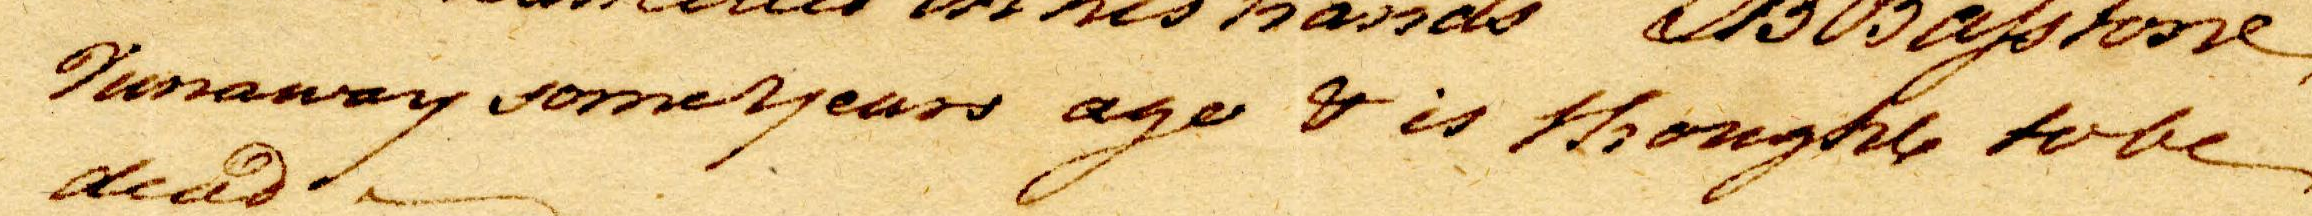runaway some years ago & is thought to be
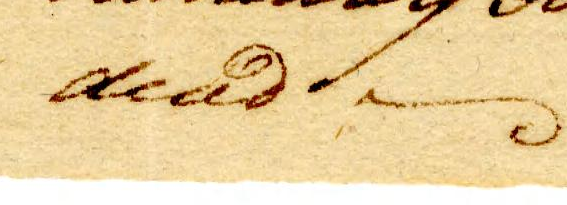dead.
